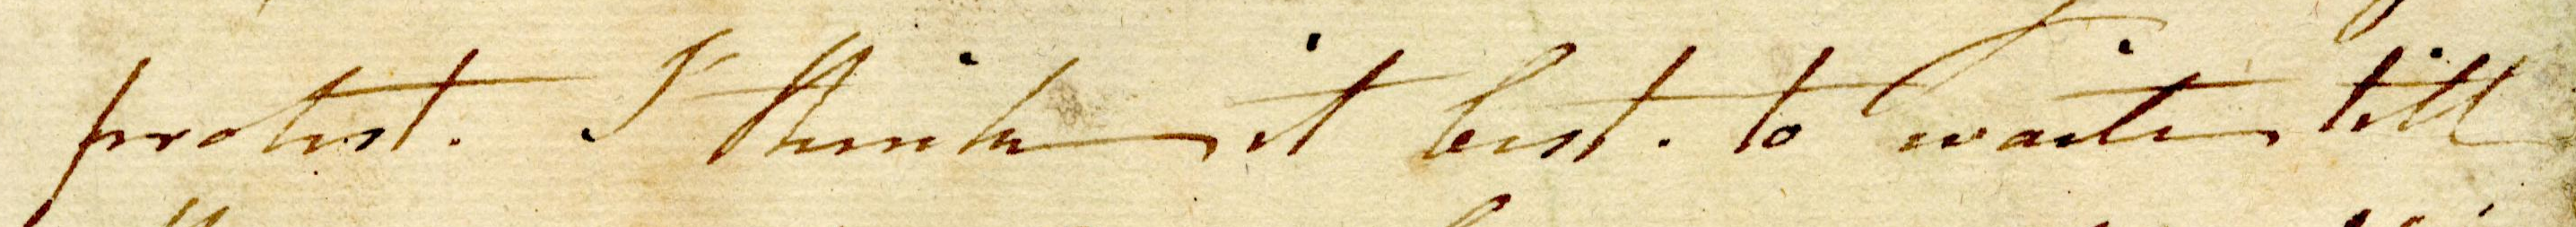protest. I think it best to wait till
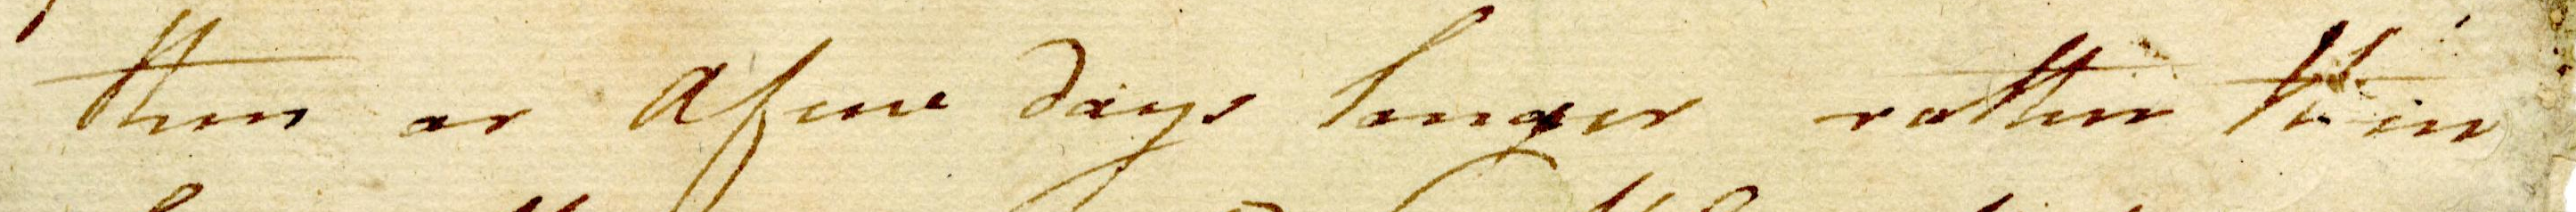then or A few days longer rather then
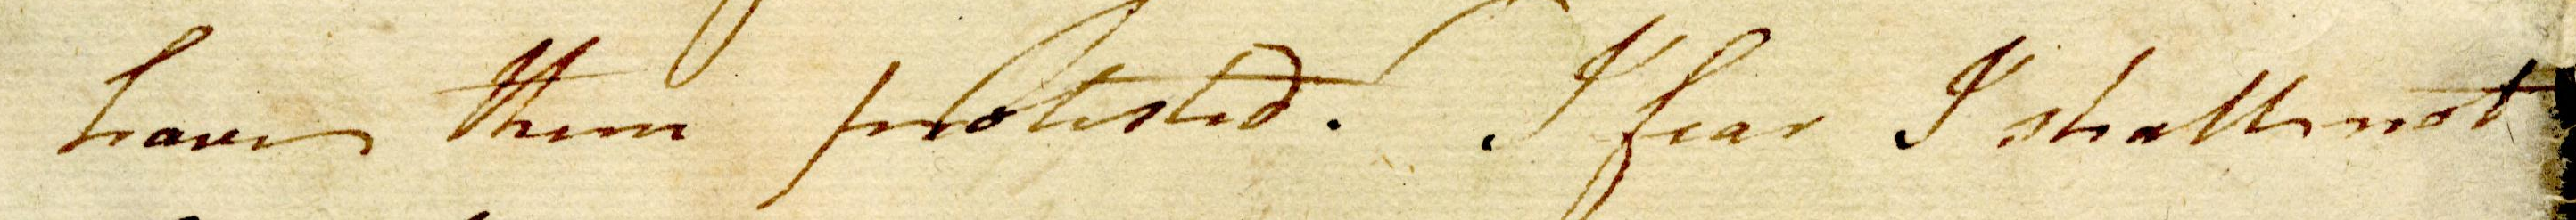have them protested. I fear I shall not
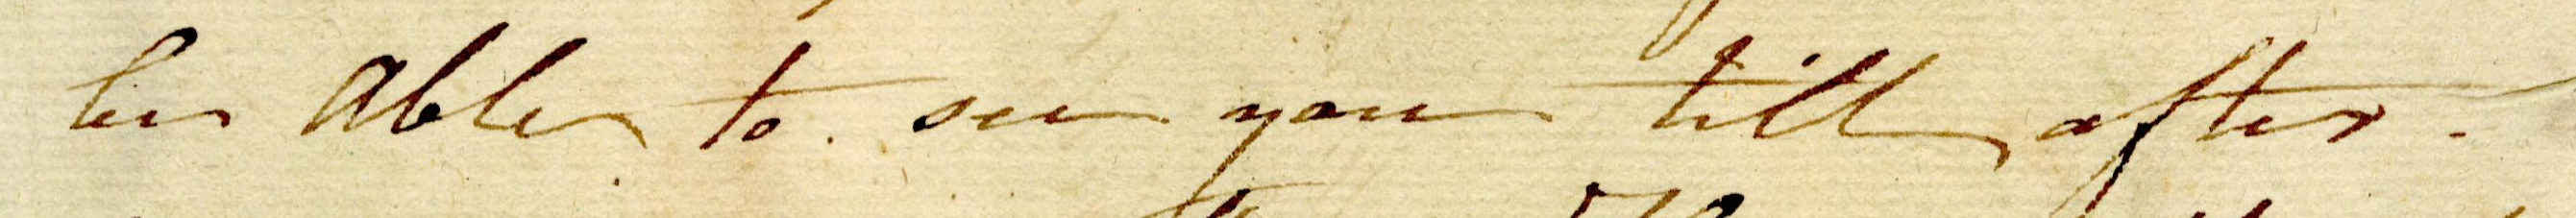be Able to see you till after.
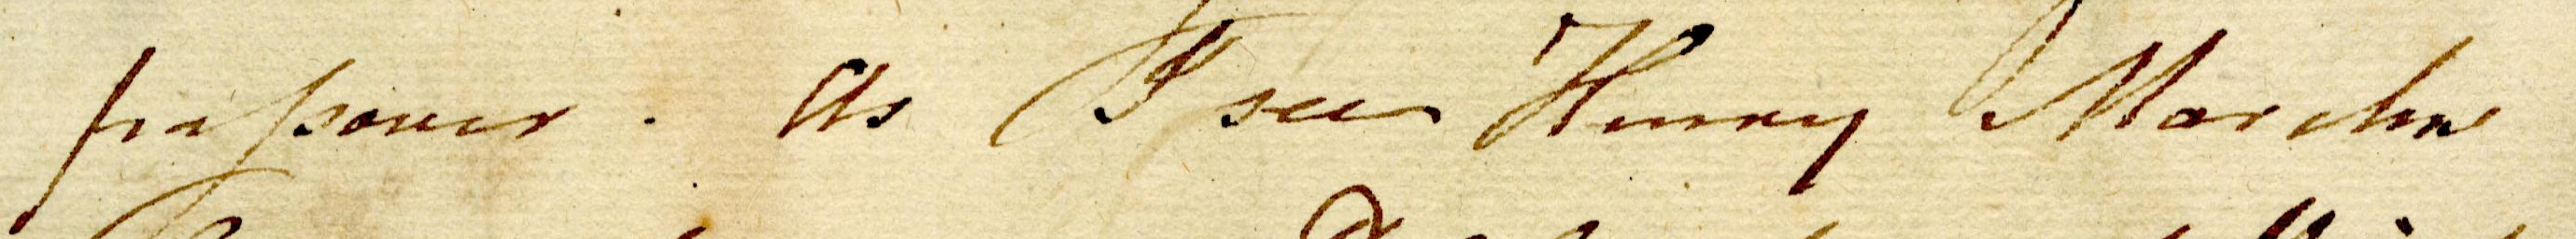passover. As I, see Henry Marchs
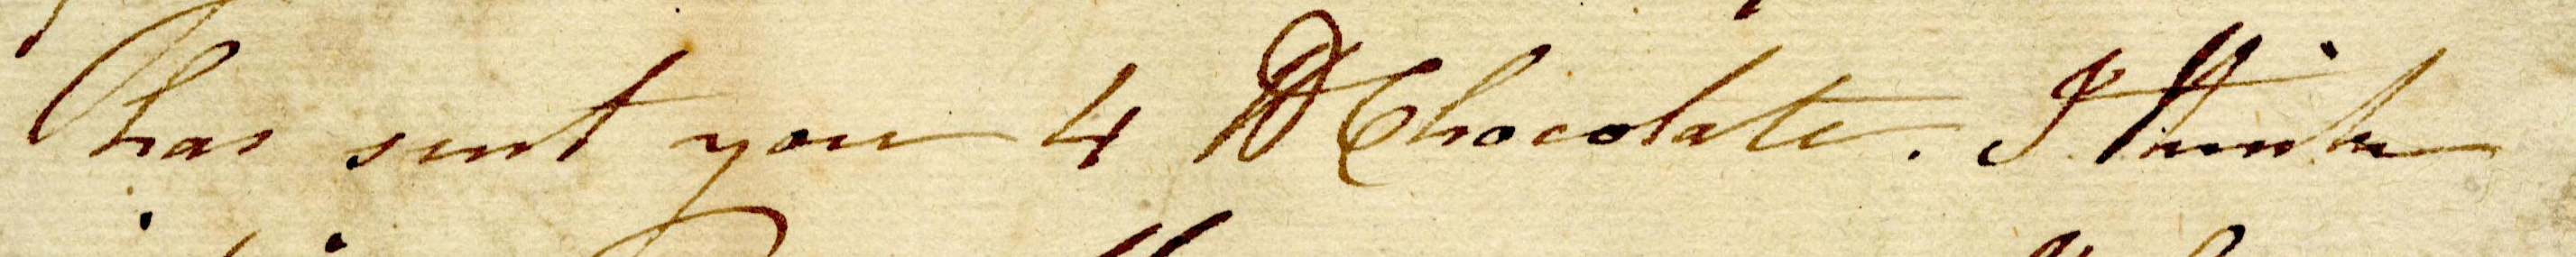has sent you 4 lb Chocolate. I think
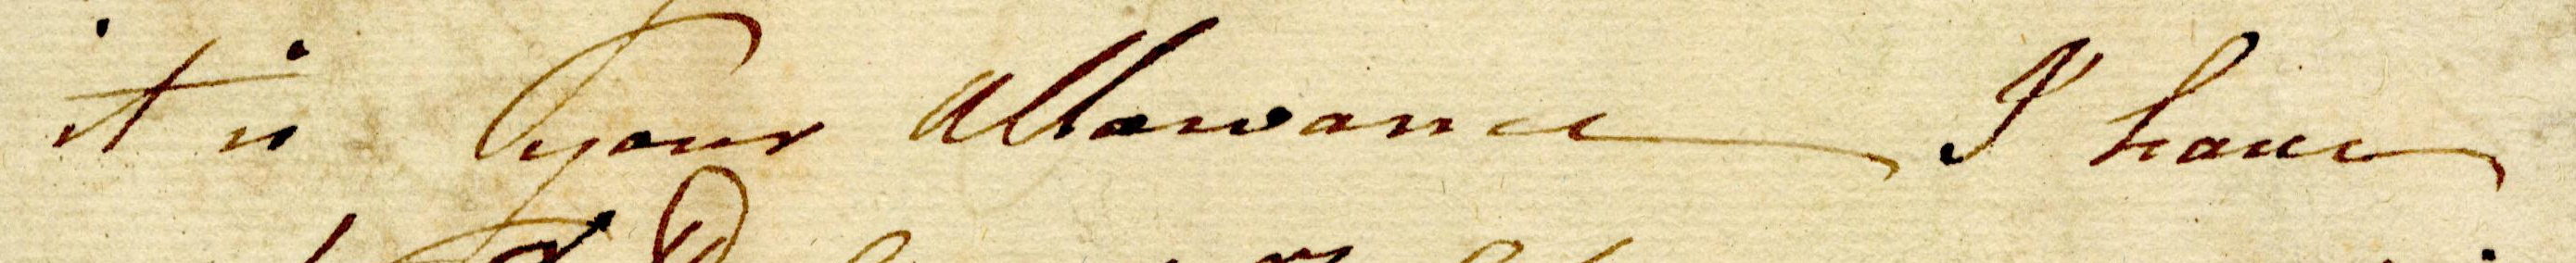it is your Allowance- I have
